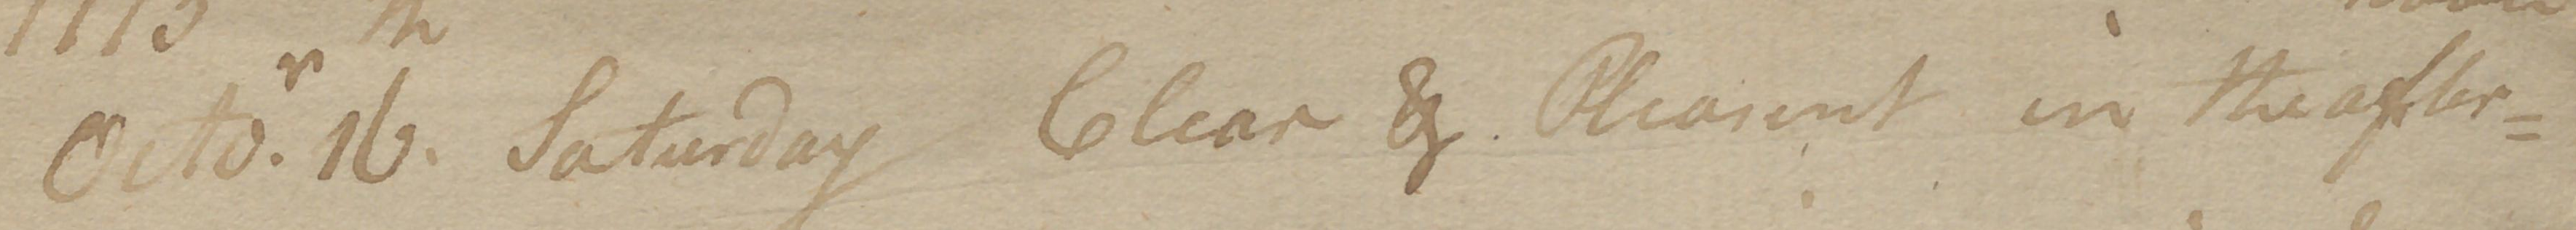Octo^r. 16^th. Saturday Clear & Pleasent in the after-
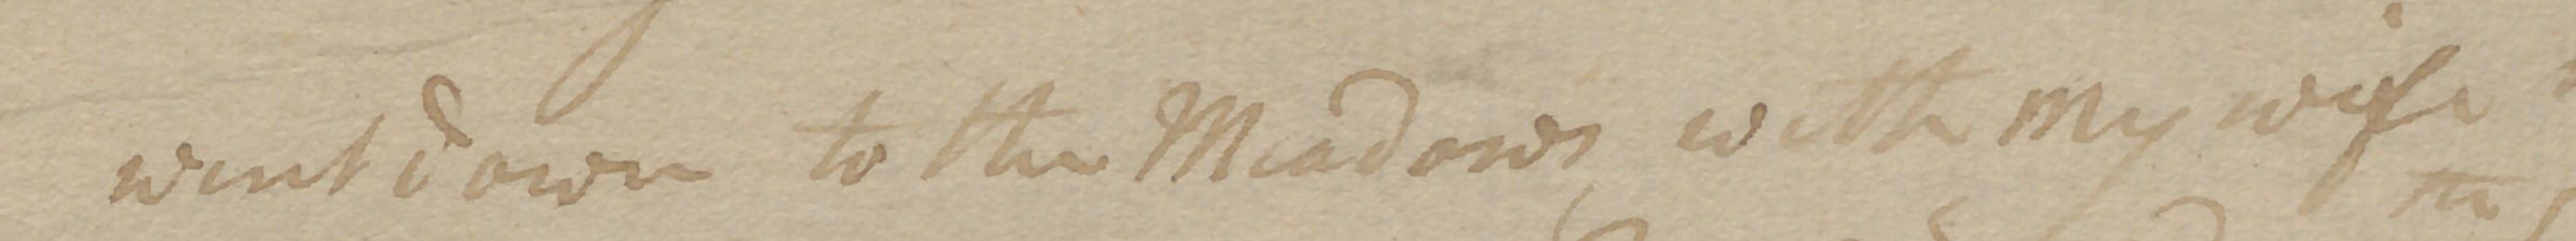went down to the Meedows with my wife
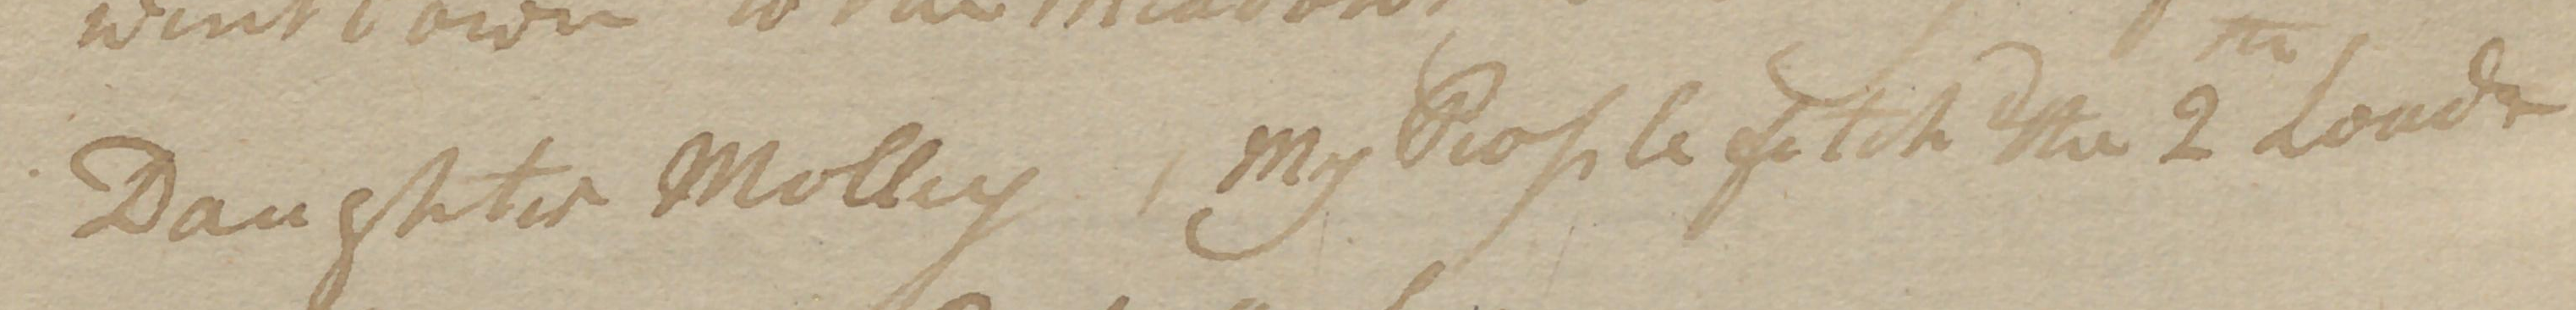Daughter Molley, My People fetch^d the 2^th Loads
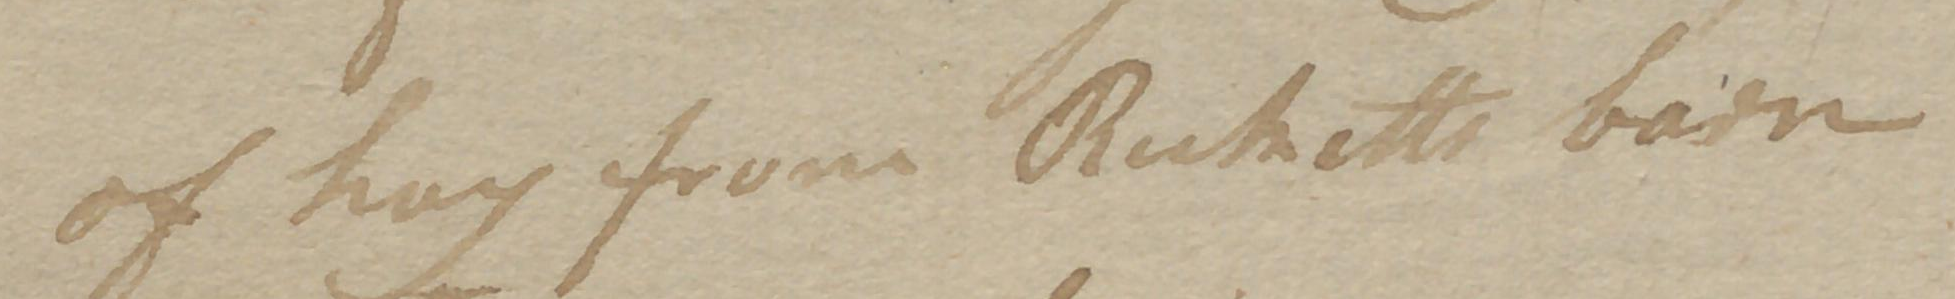of hay from Rechetts barn
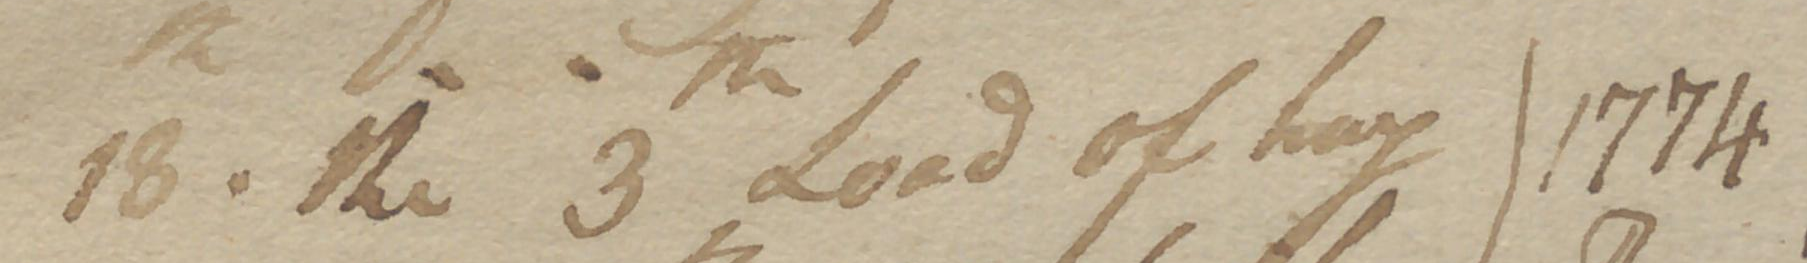18. the 3^th Load of hay 1774
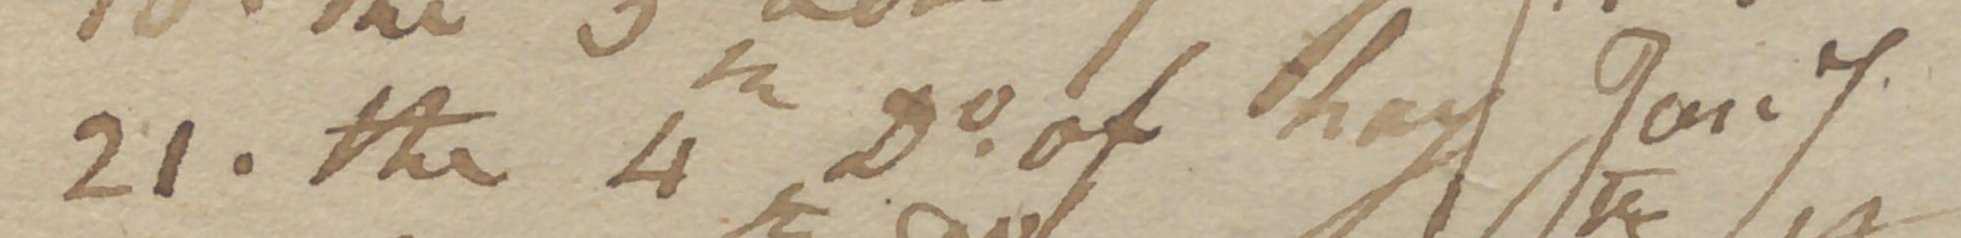21^th. the 4^th D^o. of hay Jan^y.
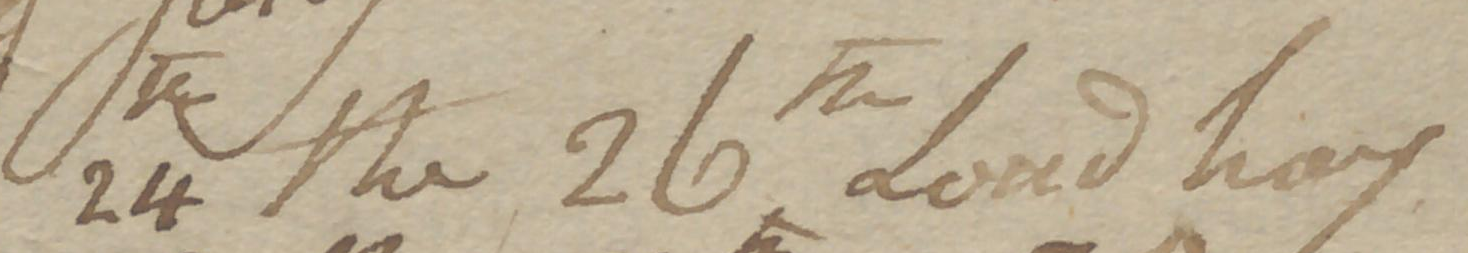24^th the 26^th. Load hart
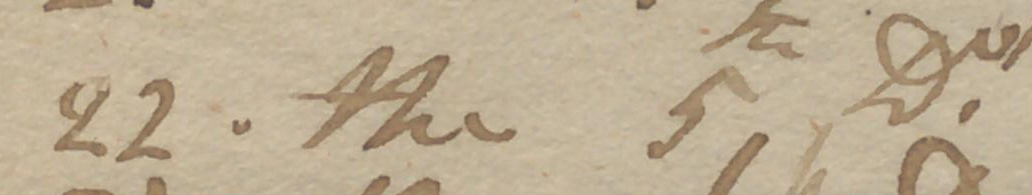22^. the 5^th D^o.
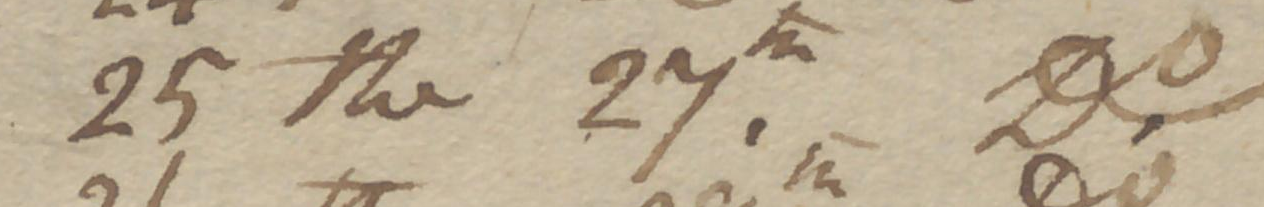25 the 27^th. D^o.
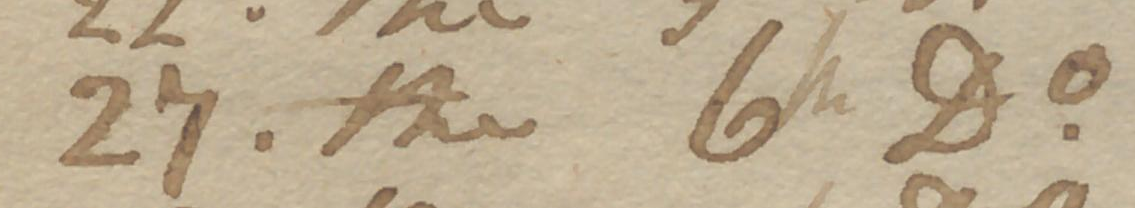27. the 6^th D^o.
